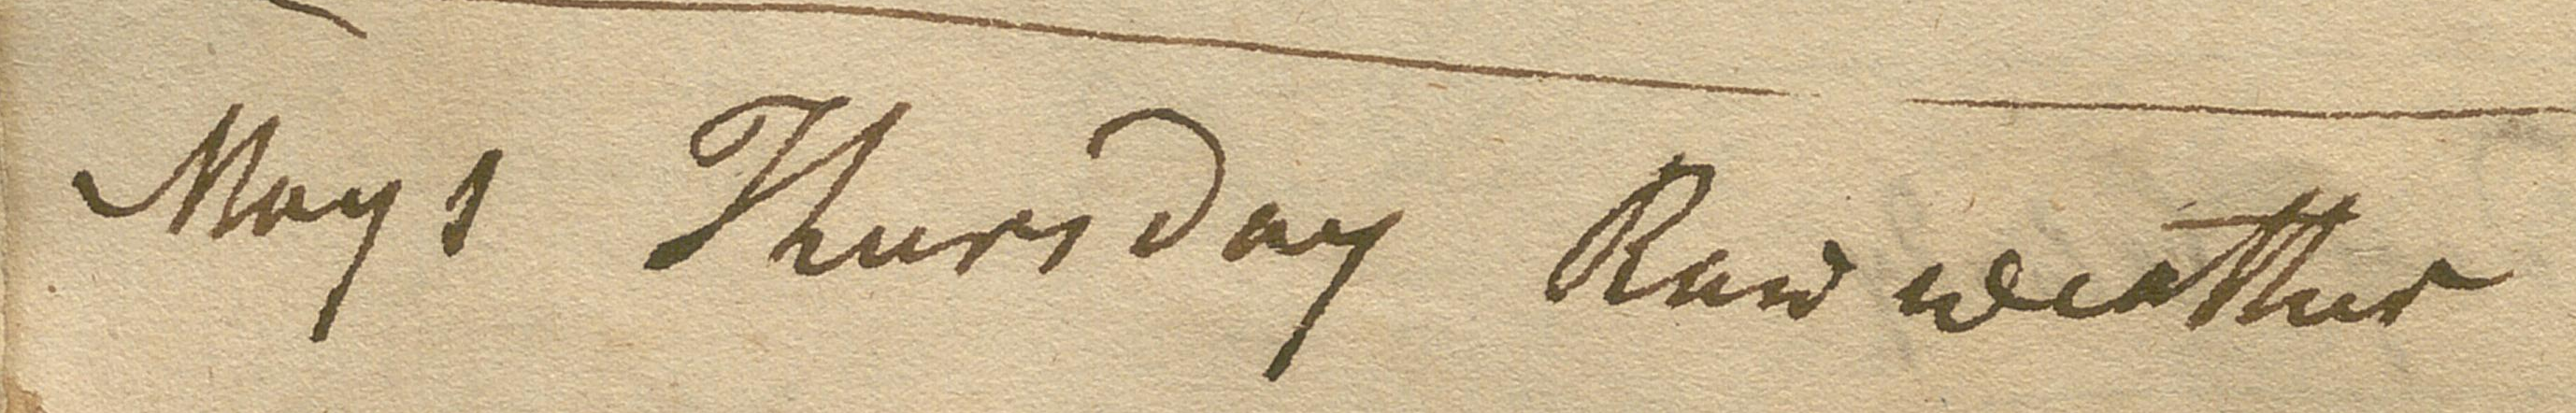May 1 Thursday Raw weather
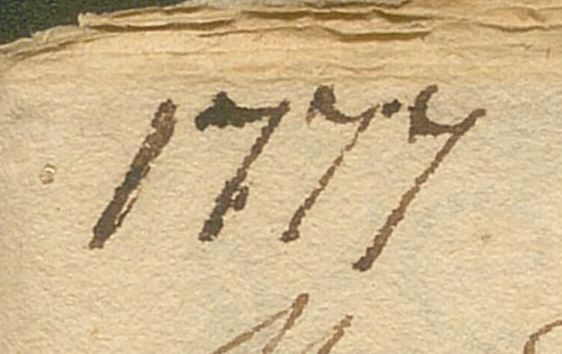1777
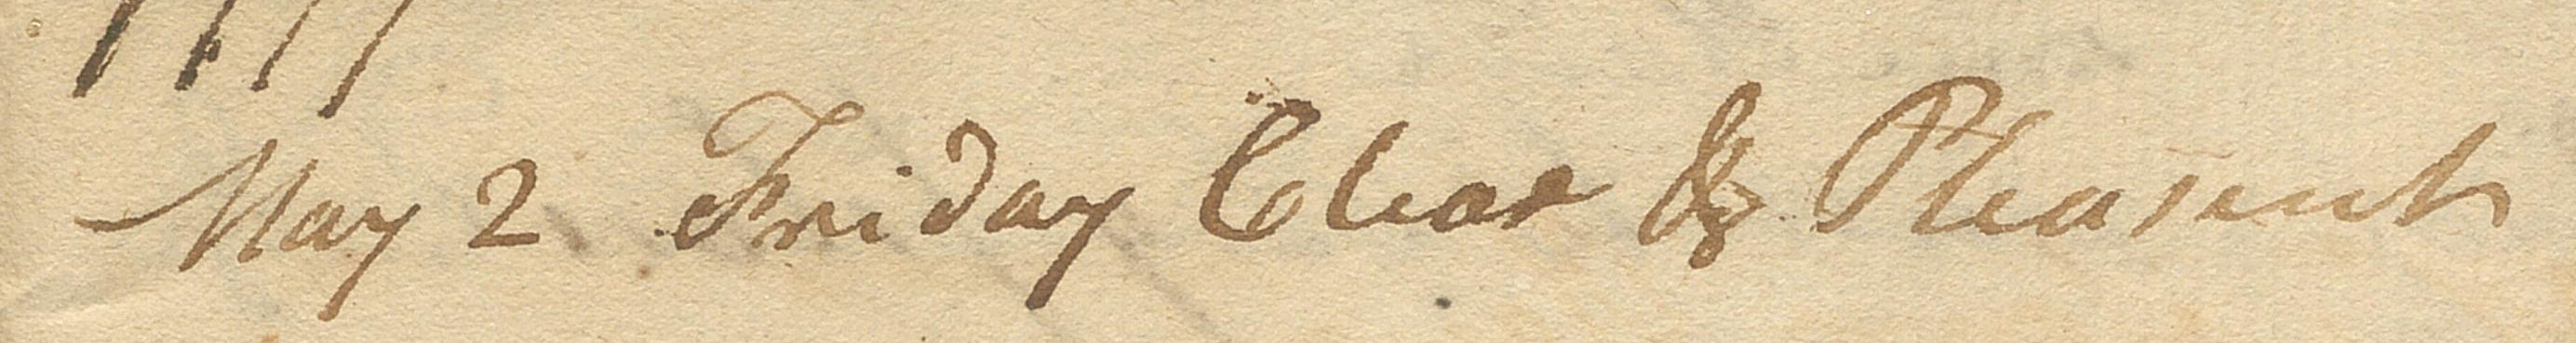May 2 Friday Clear & Pleasent
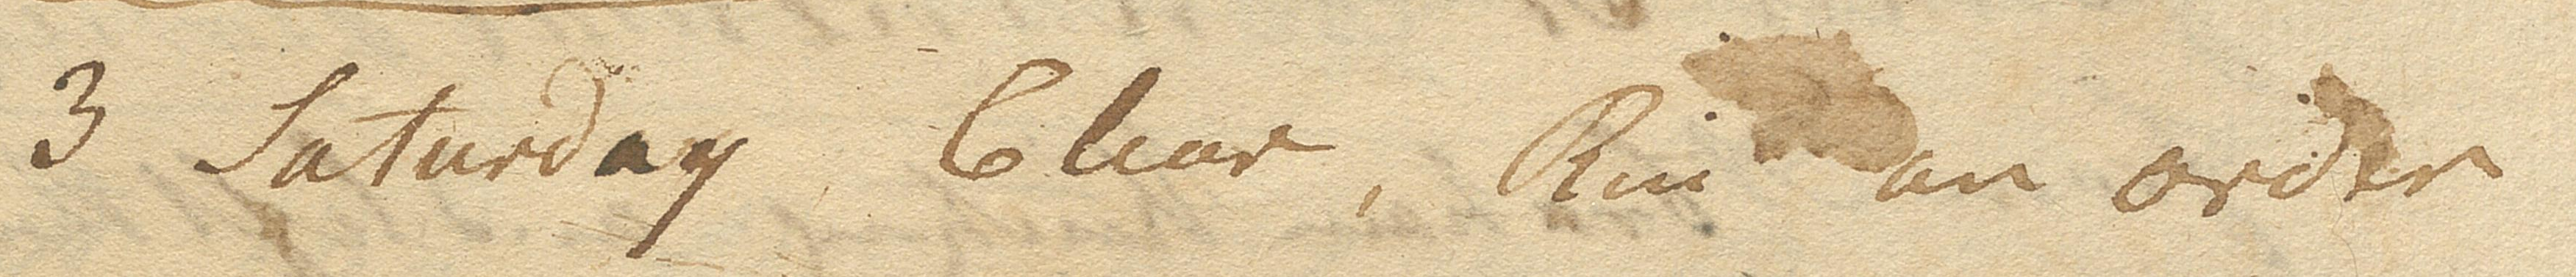3 Saturday Clear, Rec^d an order
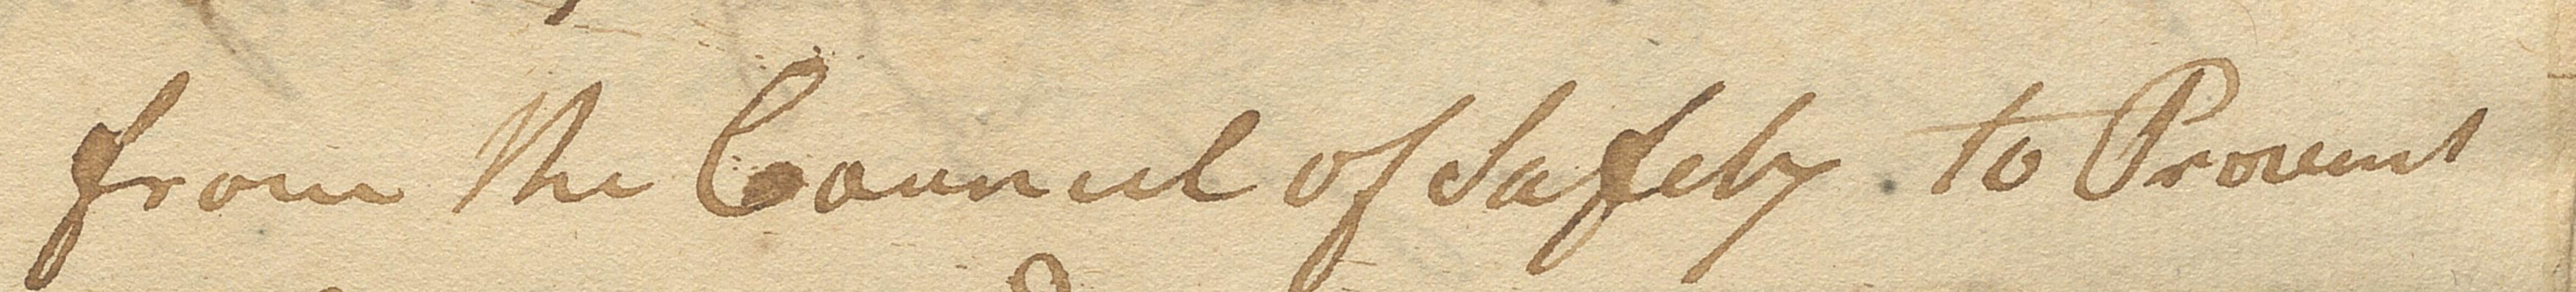from the Council of Safely to Provent
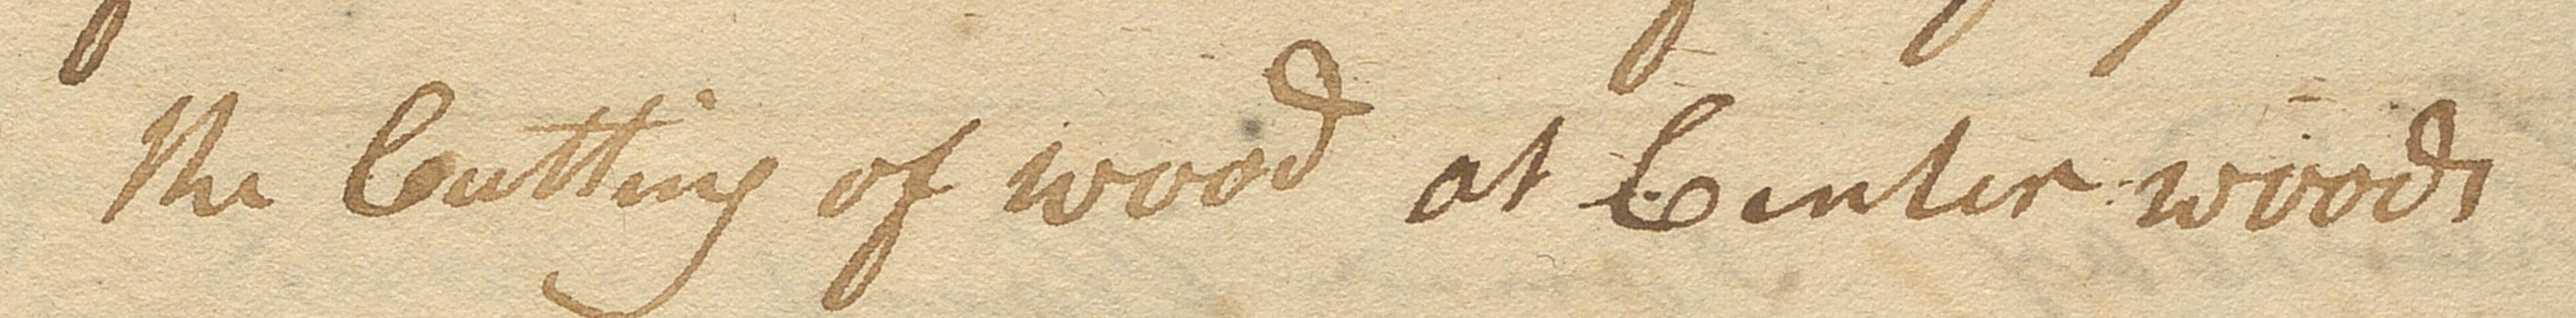the Cutting of wood at Center woods
